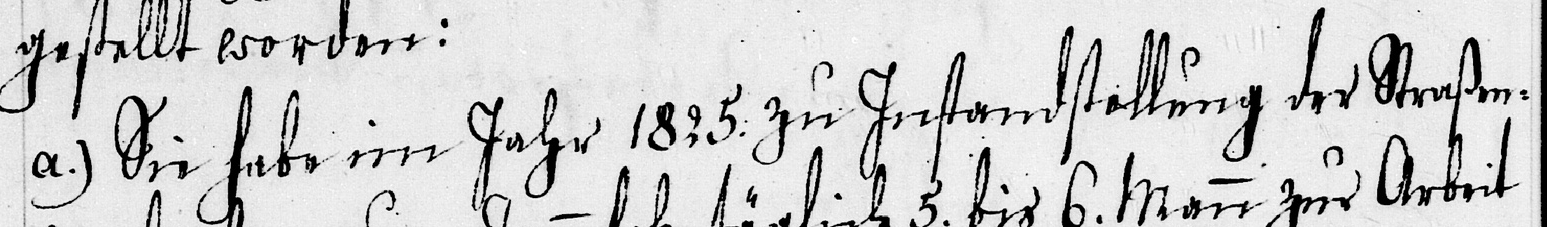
a.) Sie habe im Jahr 1825. zu Instandstellung der Straßen¬
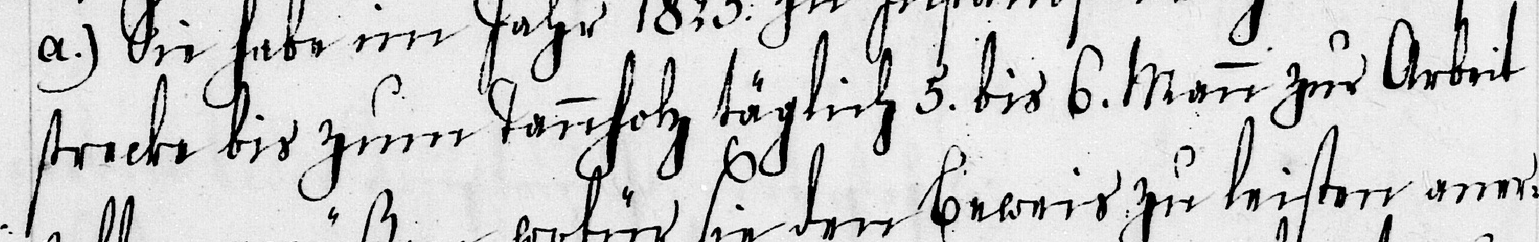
strecke bis zum Tannholz täglich 5. bis 6. Mann zur Arbeit
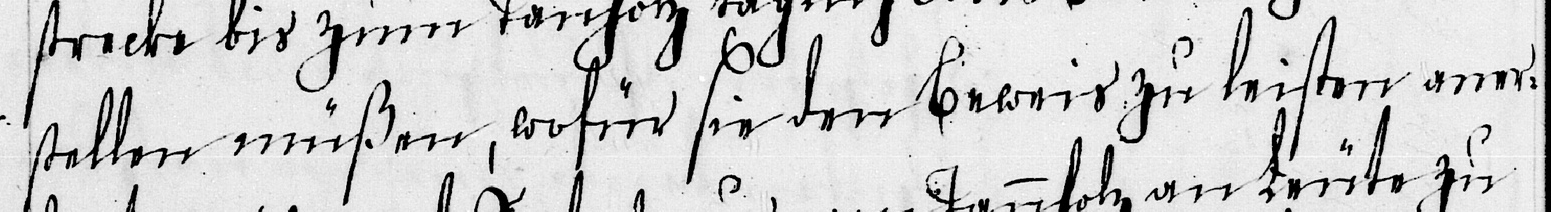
stellen müßen, wofür sie den Beweis zu leisten aner¬
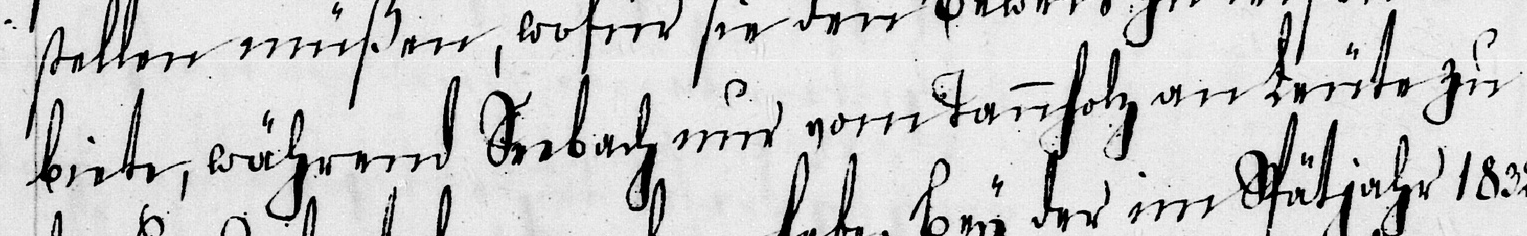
biete, während Seebach nur vom Tannholz an Leute zu
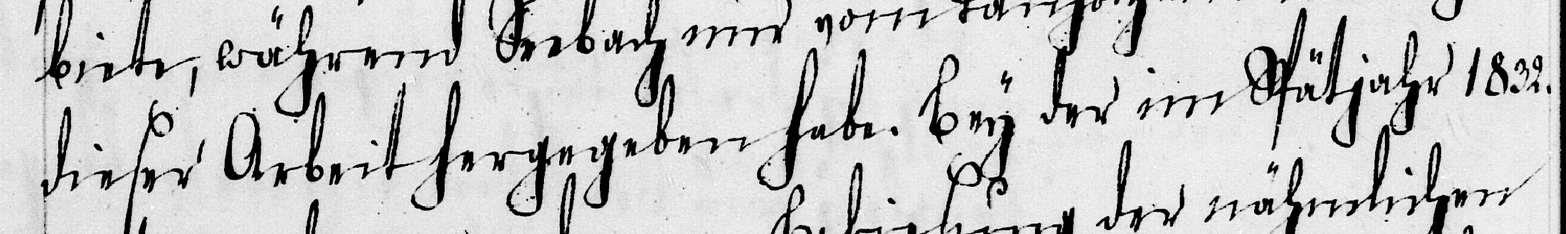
dieser Arbeit hergegeben habe. Bey der im Spätjahr 1832.
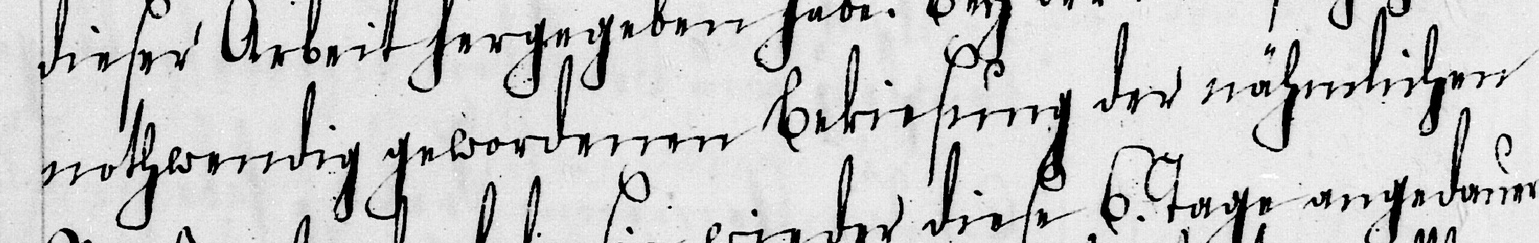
nothwendig gewordenen Bekiesung der nähmlichen
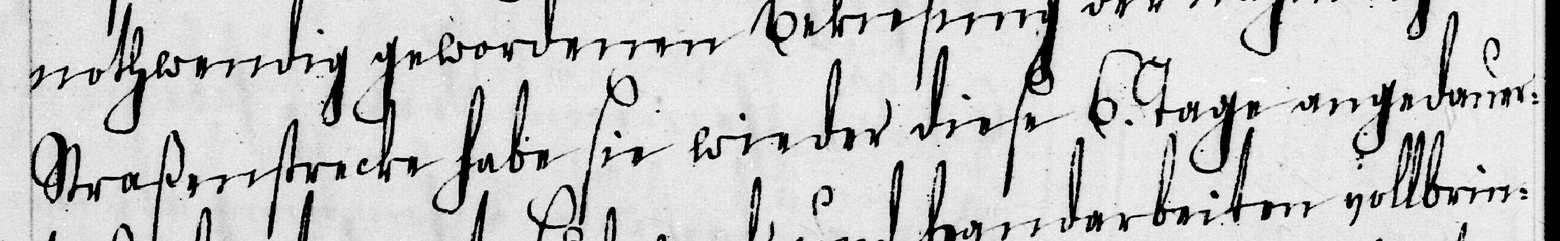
Straßenstrecke habe sie wieder diese 6. Tage angedauer¬
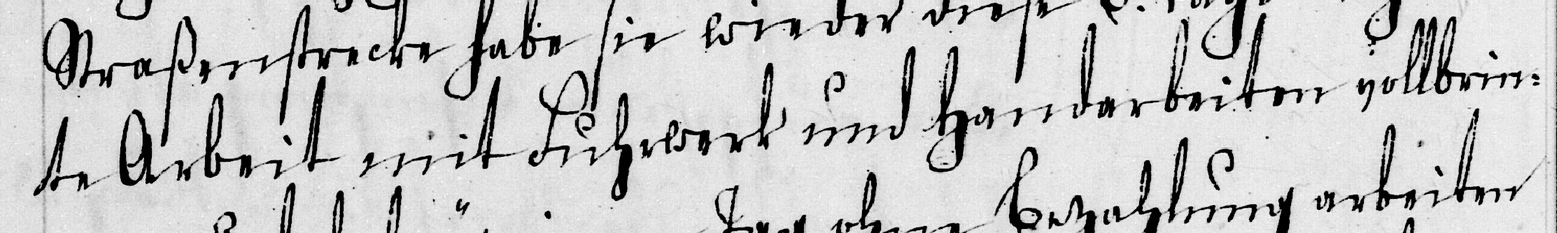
te Arbeit mit Fuhrwerk und Handarbeiten vollbrin¬
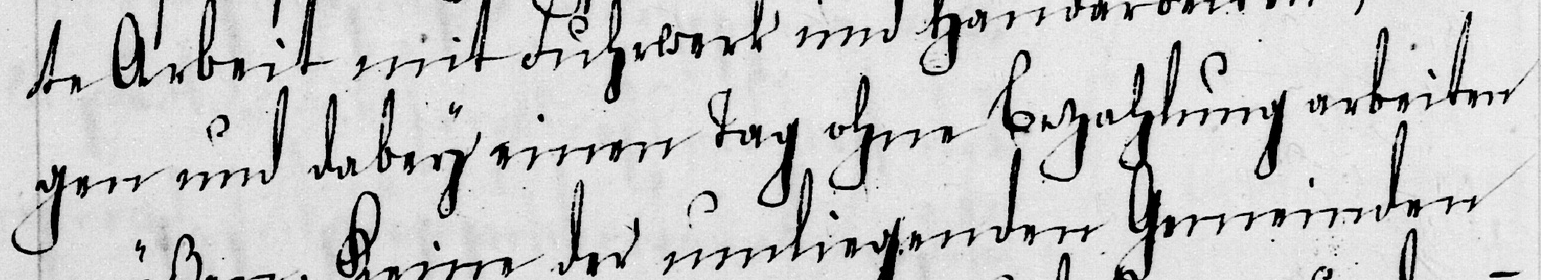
gen und dabey einen Tag ohne Bezahlung arbeiten
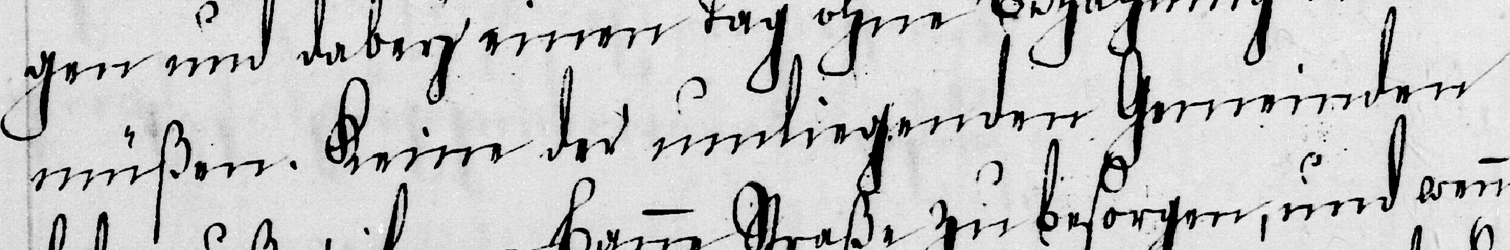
müßen. Keine der umliegenden Gemeinden
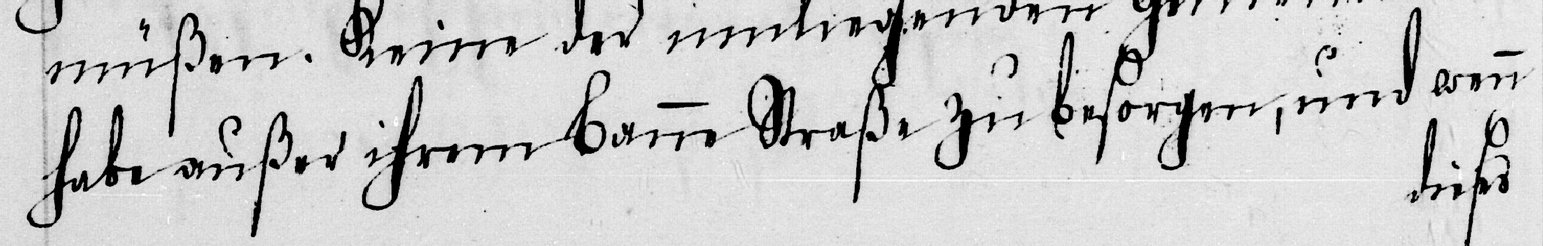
habe außer ihrem Banne Straße zu besorgen, und wenn
